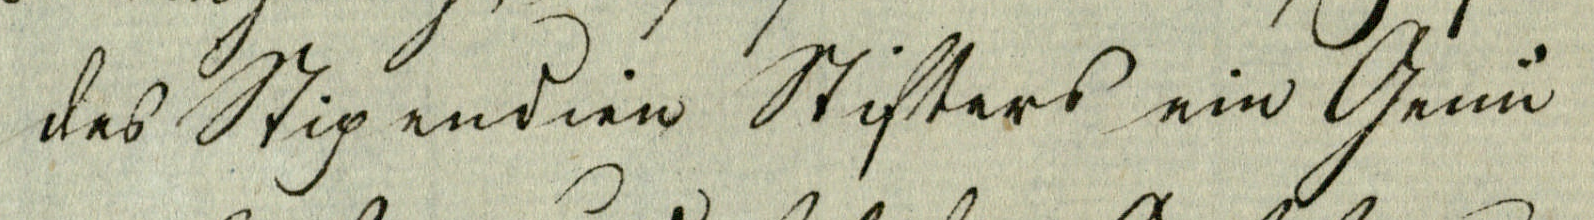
des Stipenien Stifters ein Genü¬
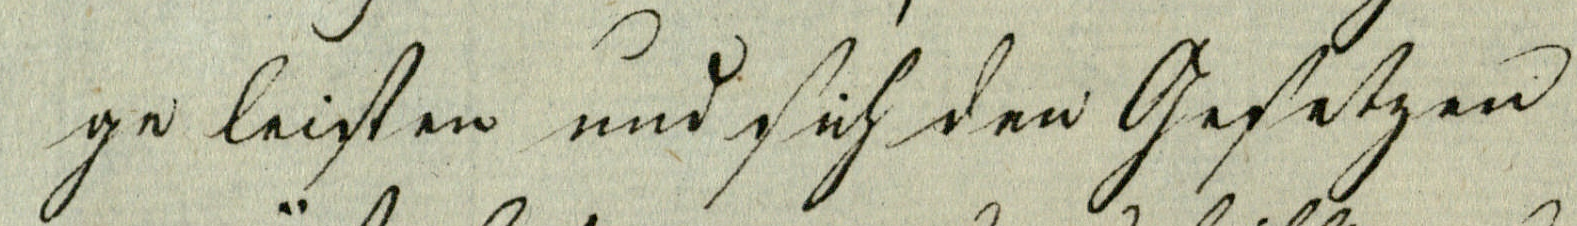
ge leisten und sich den Gesetzen
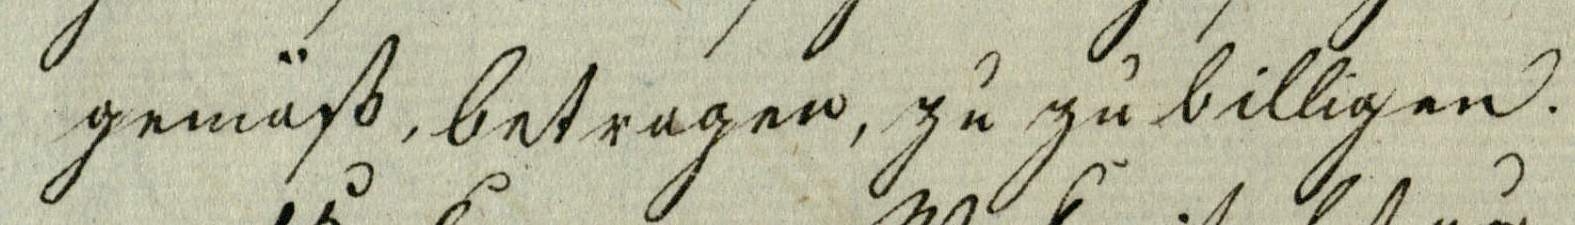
gemäß, betragen, zu zu billigen.
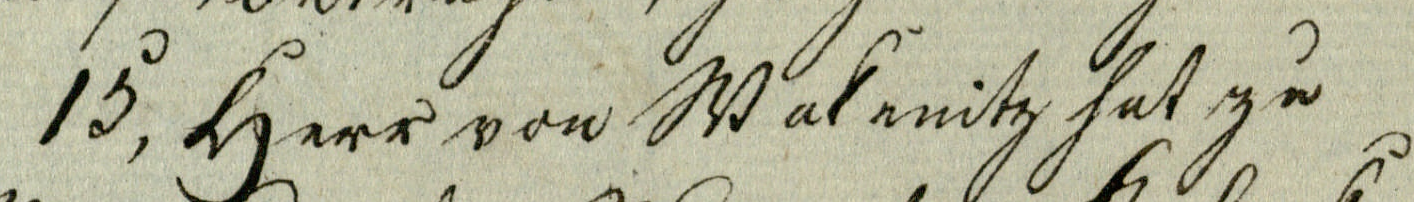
15, Herr von Wakenitz hat zu
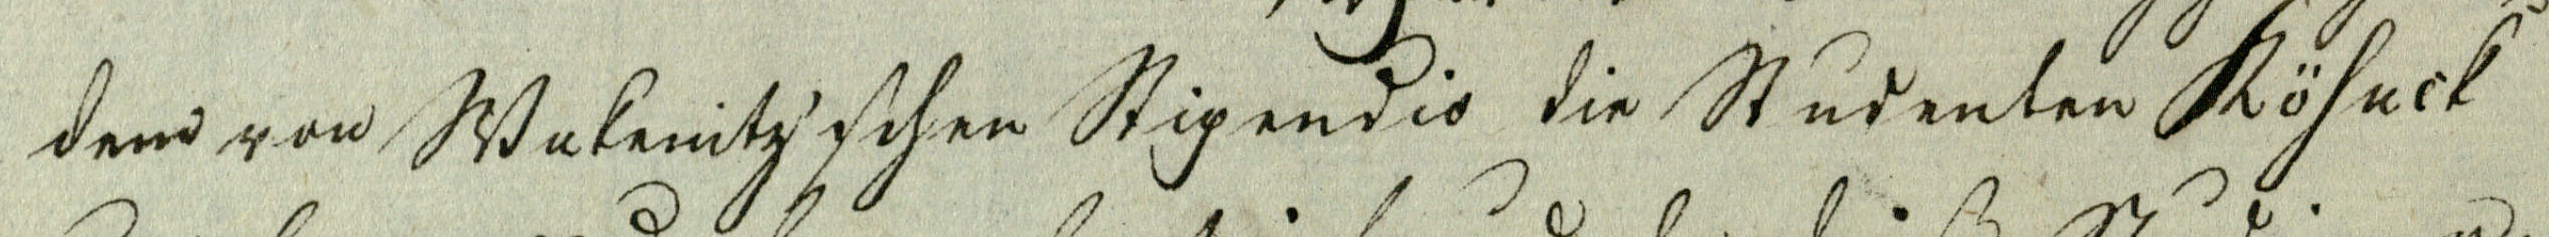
dem von Wakenitz'schen Stipendio die Studenten Köhnck
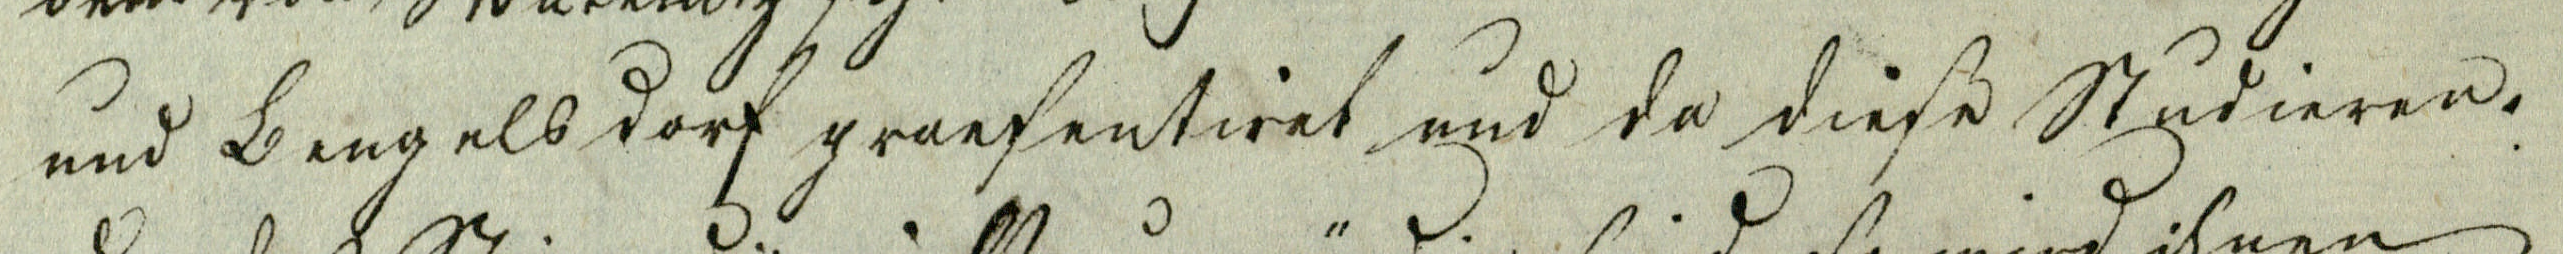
und Bengelsdorf praesentiret und da diese Studieren¬
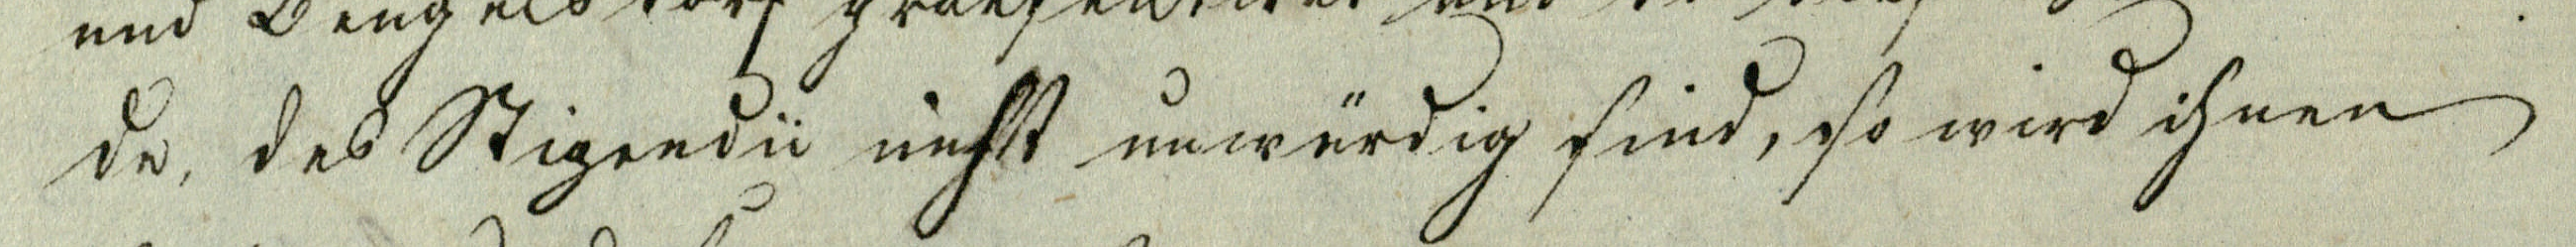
de, des Stipendii nicht unwürdig sind, so wird ihnen
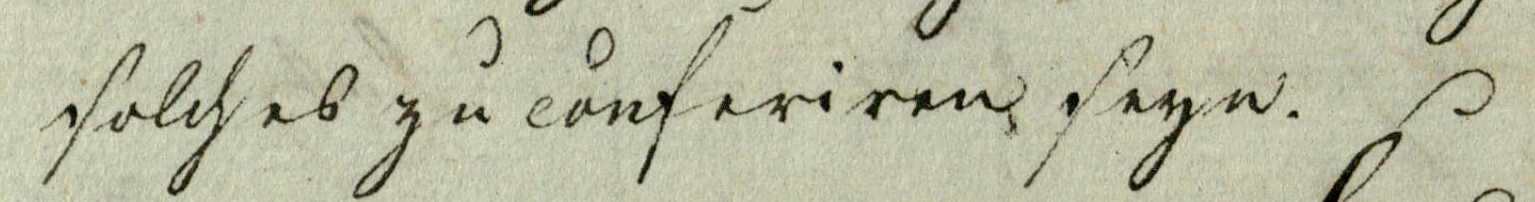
solches zu conferiren seyn.
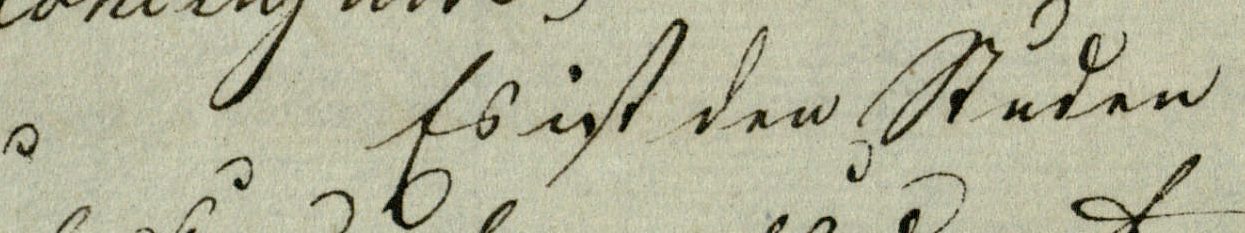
Es ist den Studen¬
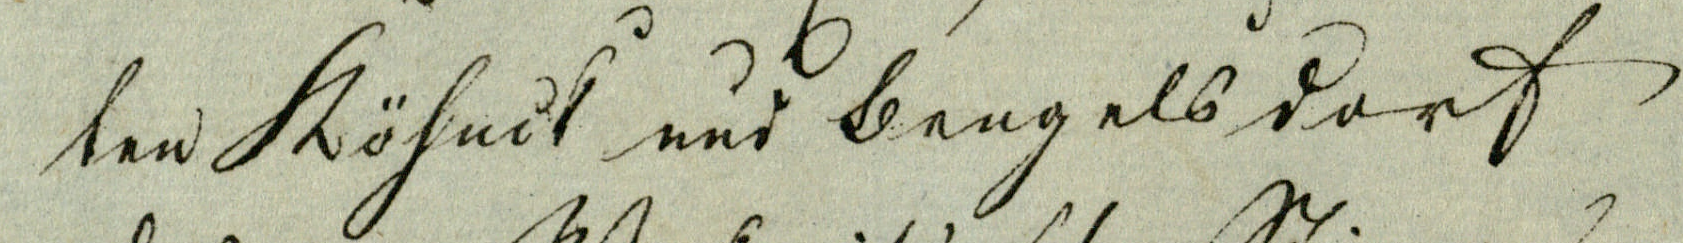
ten Köhnck und Bengelsdorf
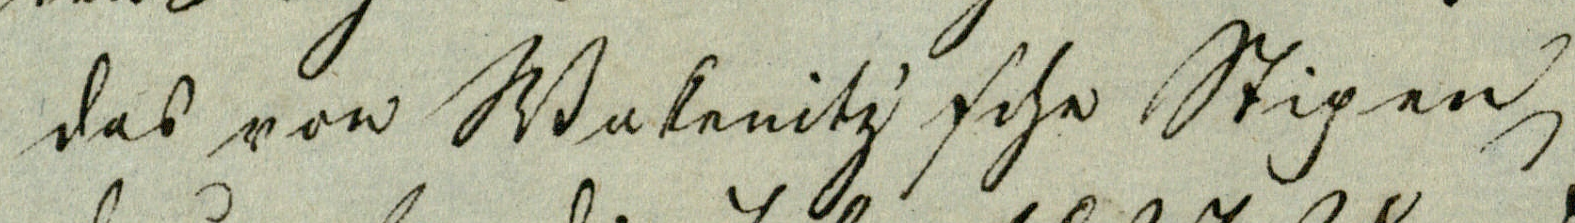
das von Wakenitz'sche Stipen¬
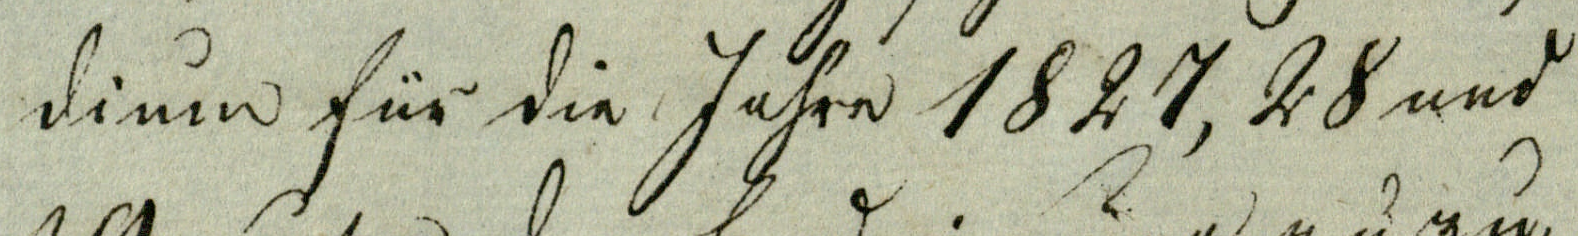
dium für die Jahre 1827, 28 und
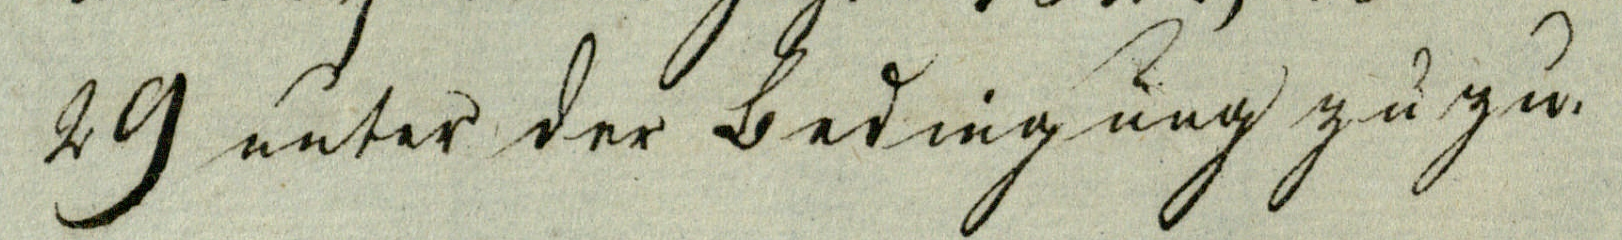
29 unter der Bedingung zu zu¬
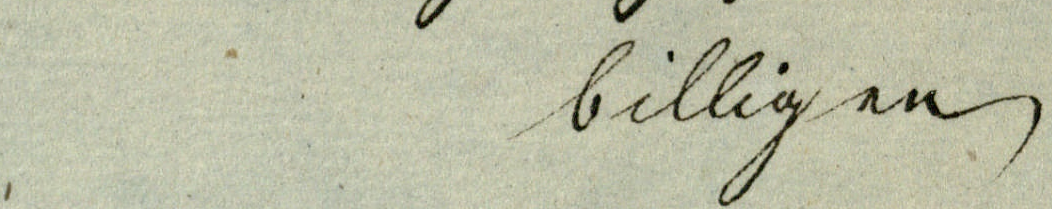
billigen
